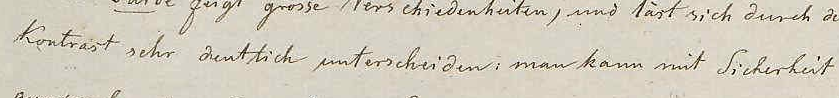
Kontrast sehr deutlich unterscheiden: man kann mit Sicherheit
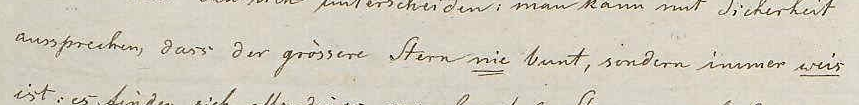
aussprechen, dass der grössere Stern nie bunt, sondern immer weis
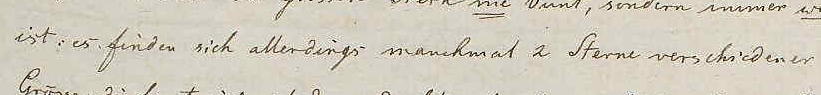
ist: es finden sich allerdings manchmal 2 Sterne verschiedener
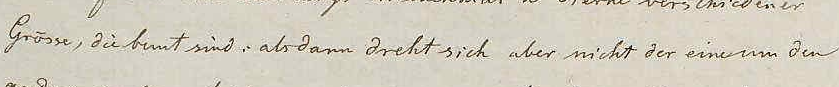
Grösse, die bunt sind: alsdann dreht sich aber nicht der eine um den
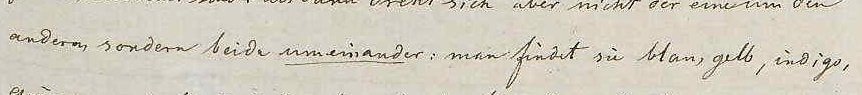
andern, sondern beide umeinander: man findet sie blau, gelb, indigo
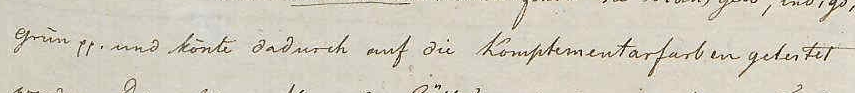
grün pp. und könte dadurch auf die Komplementarfarben geleitet
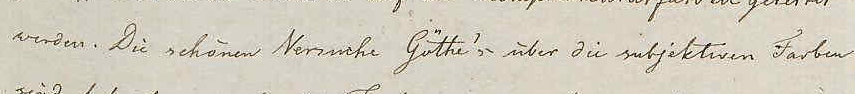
werden. Die schönen Versuche Göthe's über die subjektiven Farben
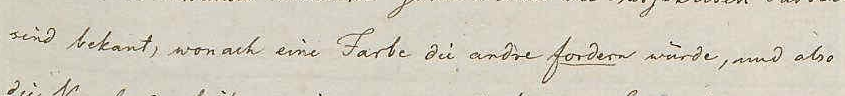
sind bekant, wonach eine Farbe die andre fordern würde, und also
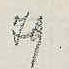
diese
